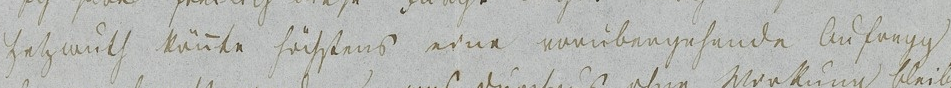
Hetzwuth könnte höchstens eine vorübergehende Aufregg
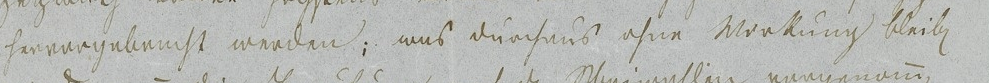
hervorgebracht werden; was durchaus ohne Wirkung bleiben
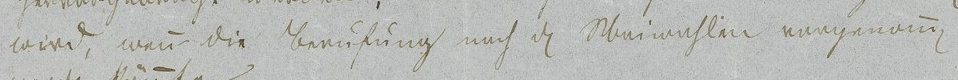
wird, wenn die Berufung nach den Maiwahlen vorgenommen
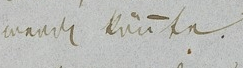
werden könnte.
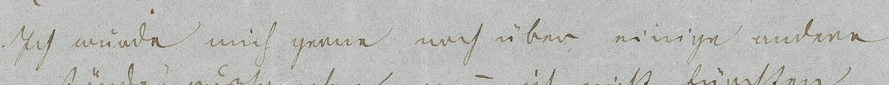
Ich würde mich gerne noch über einige andere
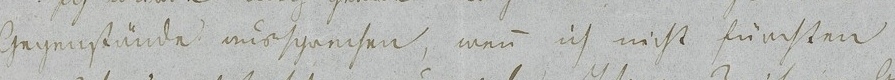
Gegenstände aussprechen, wenn ich nicht fürchten
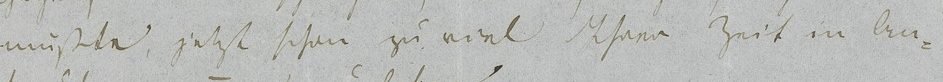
müßte, jetzt schon zu viel Ihrer Zeit in An-
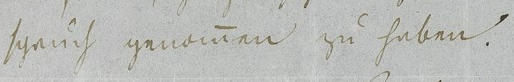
spruch genommen zu haben.
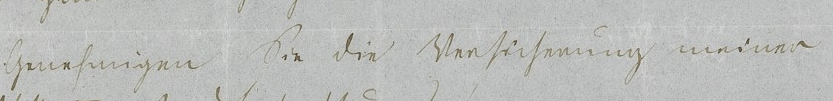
Genehmigen Sie die Versicherung meiner
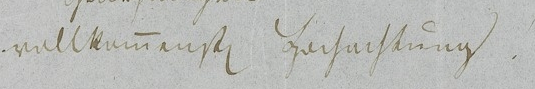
vollkommensten Hochachtung!
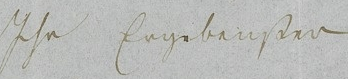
Ihr Ergebenster
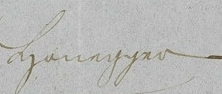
Honegger
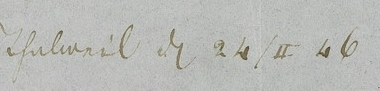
Thalweil den 24/II 46
